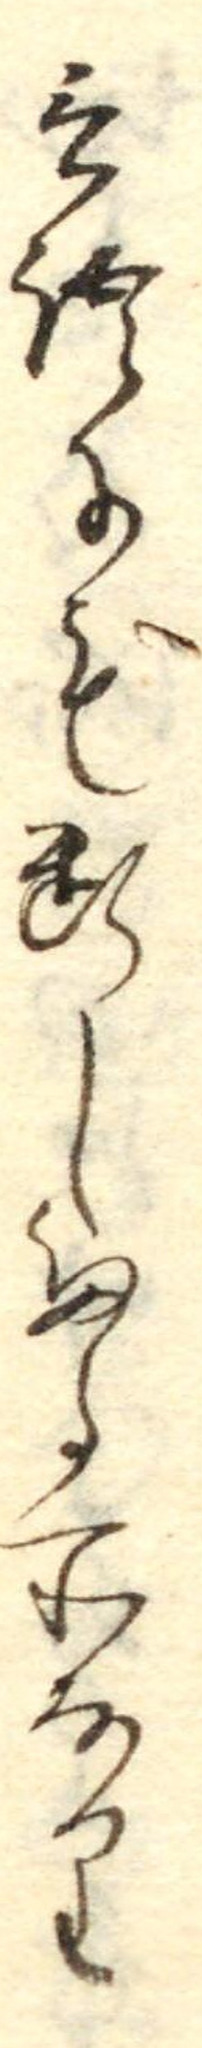言語にも断したる所なり
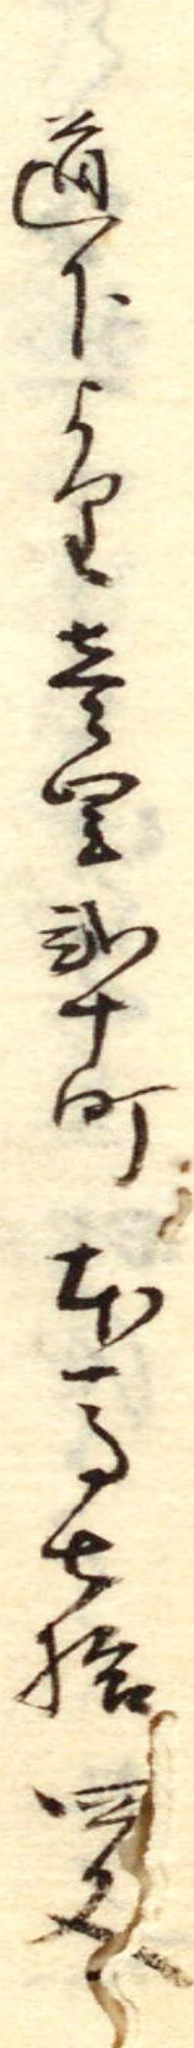道りより壱里弐十町本馬七拾四文
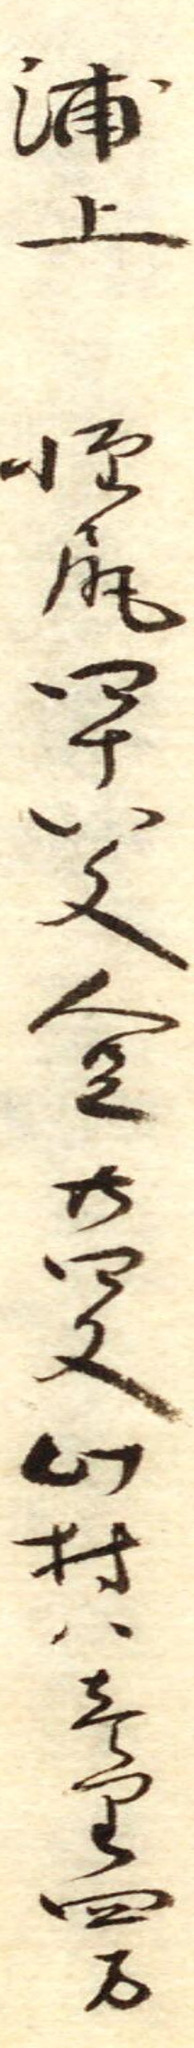浦上軽尻四十八文人足廿四文此村は壱里四方
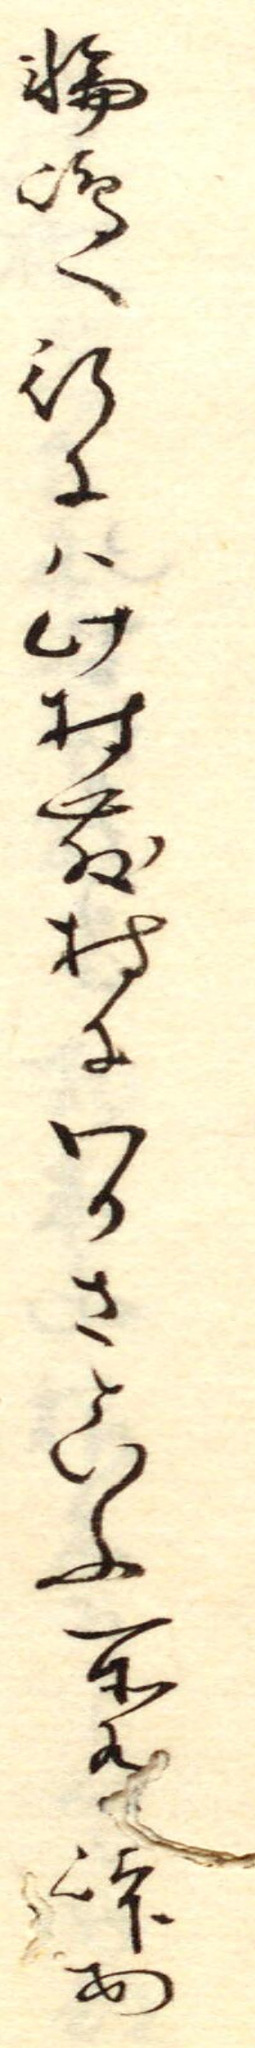輪嶋へ行には此村散村にわかさといふ所有峠あ
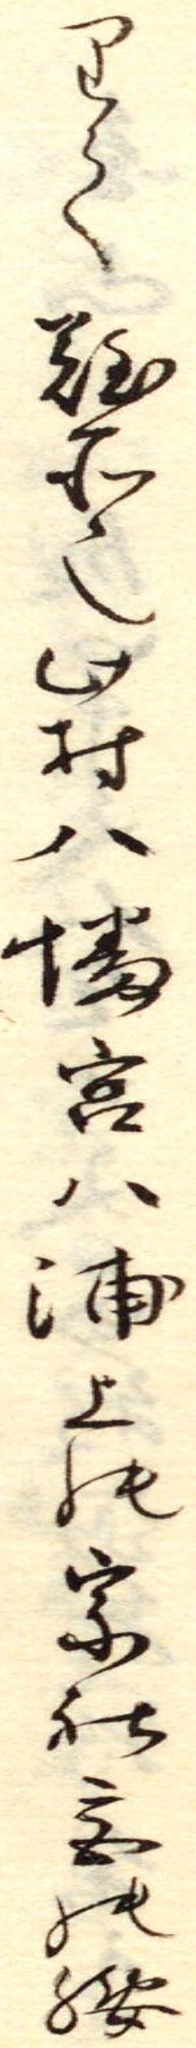りて難所也此村八番宮は浦上の宗社宮の腰
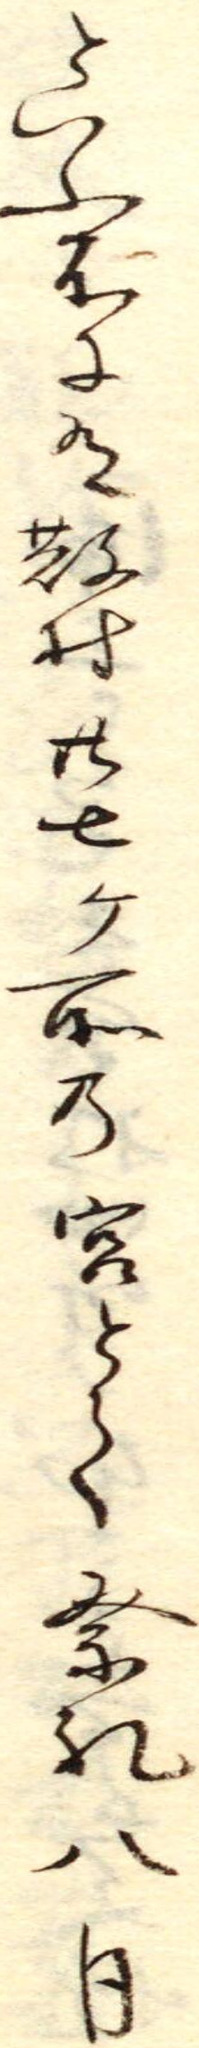といふ所に有散村廿七ヶ所の宮とて祭礼八月
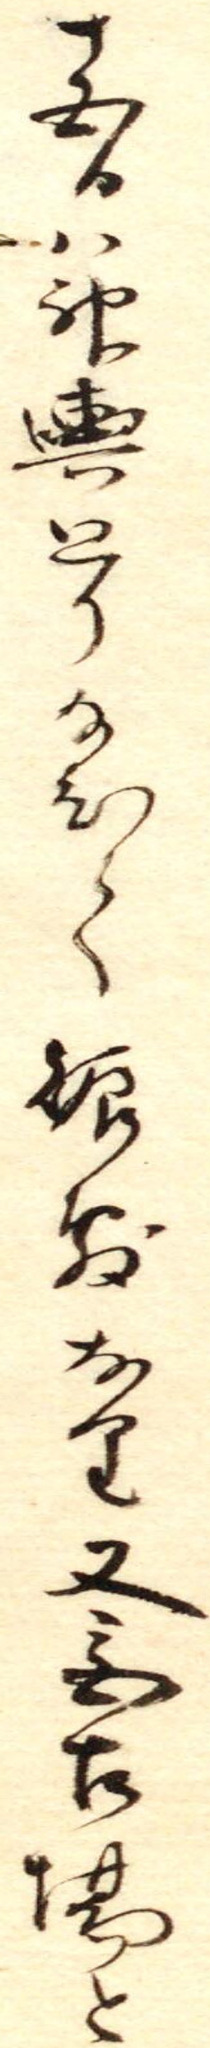十五日は神輿廻り給ひて賑敷なり又宮古場と
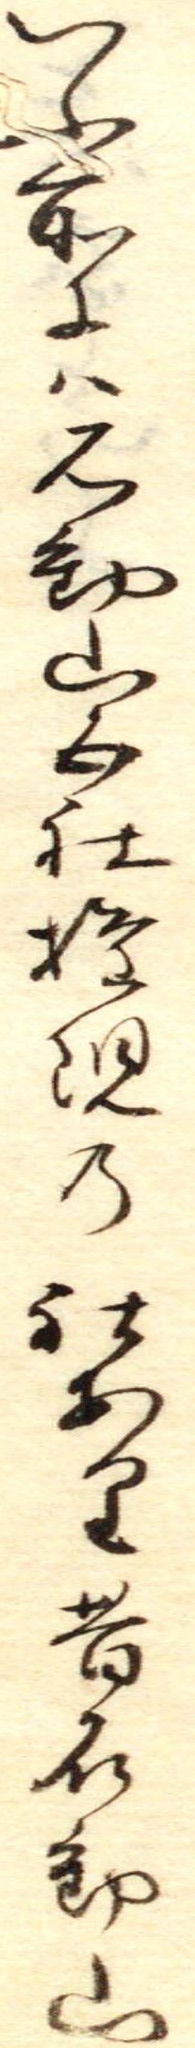いふ所には石動山五社権現の社あり昔石動山
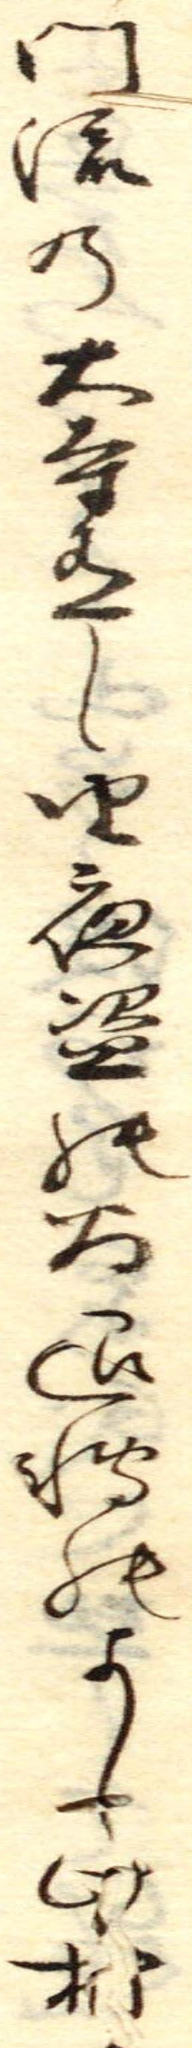門流の大寺有し由夜盗の為退転のよし此村

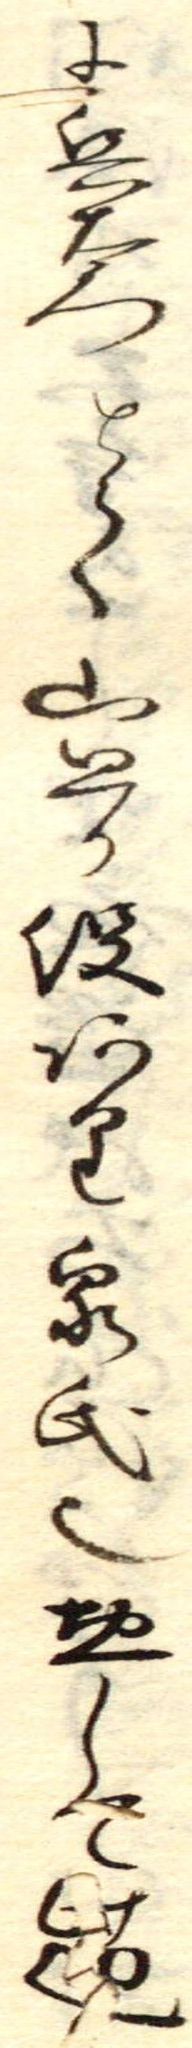に兵右衛門とて山廻り役あり泉氏也惣して此辺
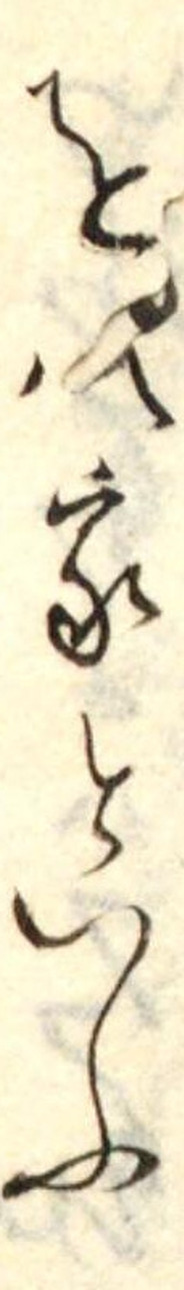を八家といふ
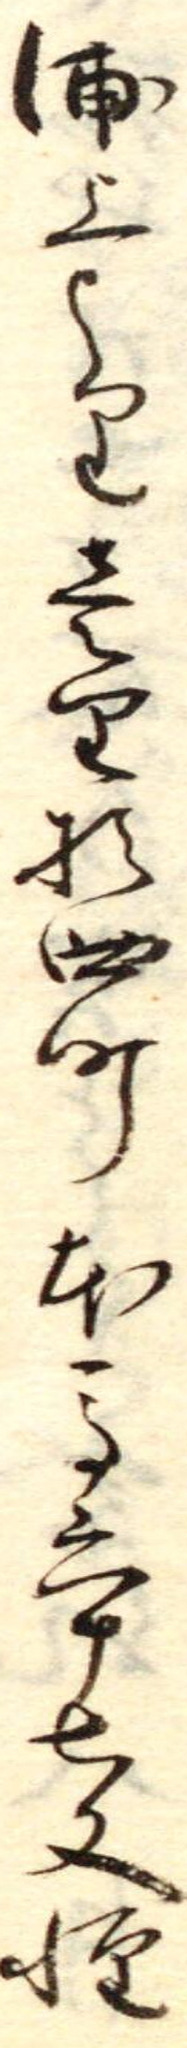浦上より壱里拾四町本馬六十七文軽
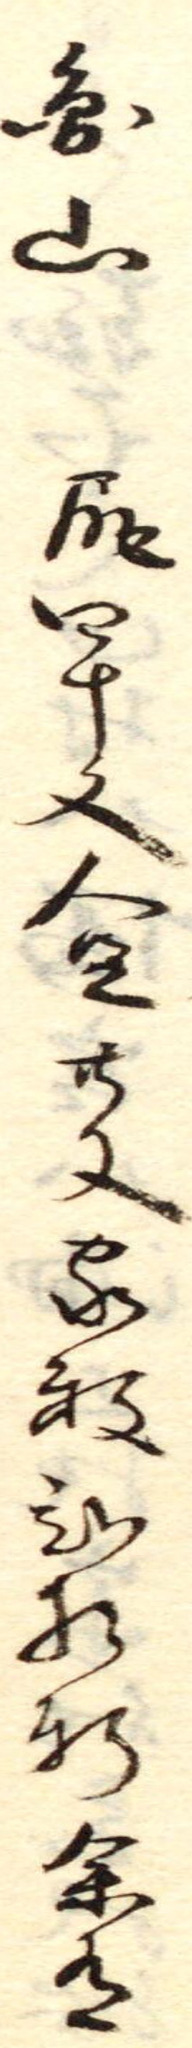円山尻四十文人足廿文家数弐拾軒余有
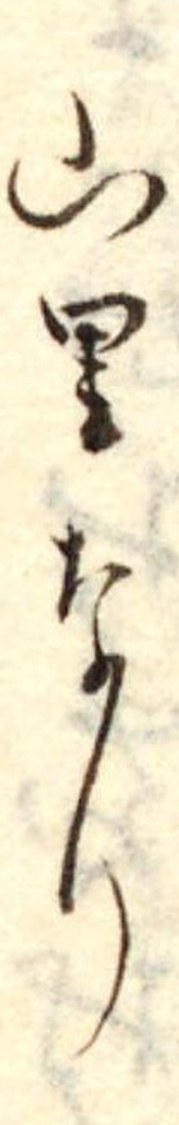山里なり
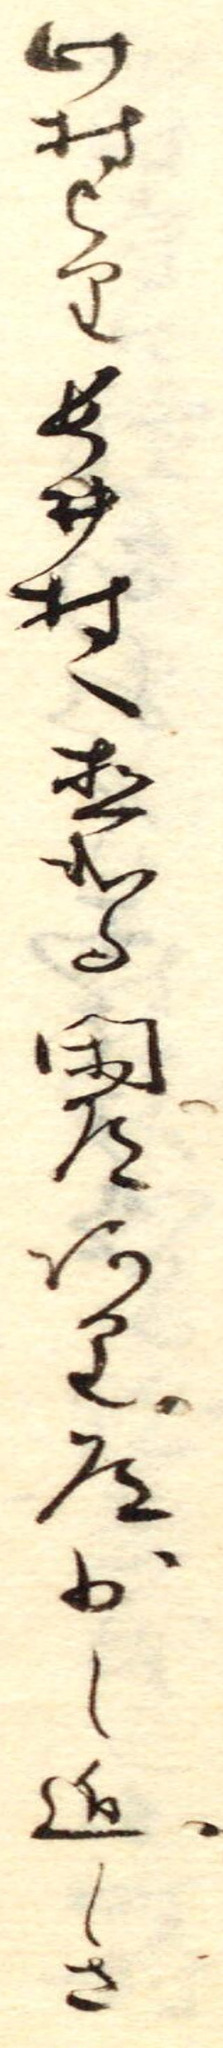此村より長井村へ直出る閑道あり道少し近しさ
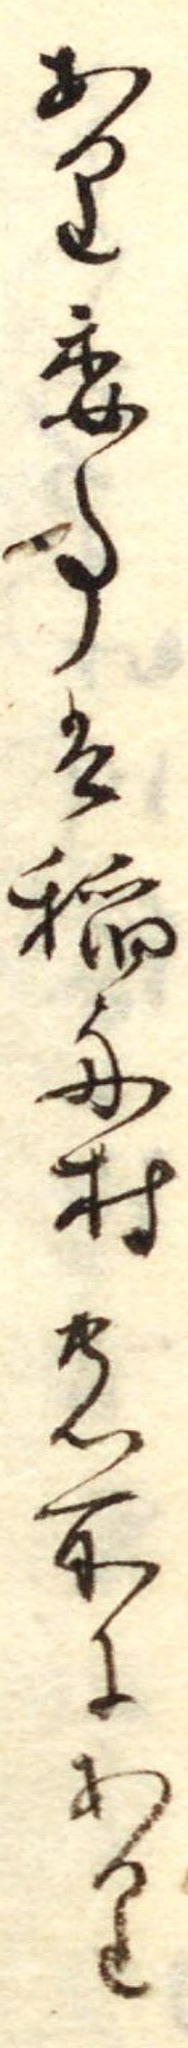あり委事は稲舟村の所にあり
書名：能登名跡誌
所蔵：Ishikawa Prefectural Library
